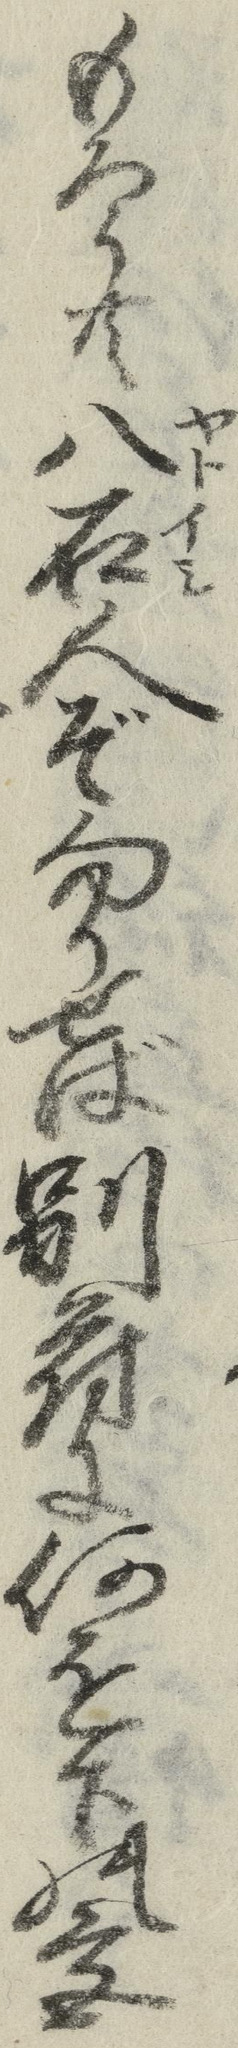もろう共八石人ぞ勿りせば別府に何を下の宮
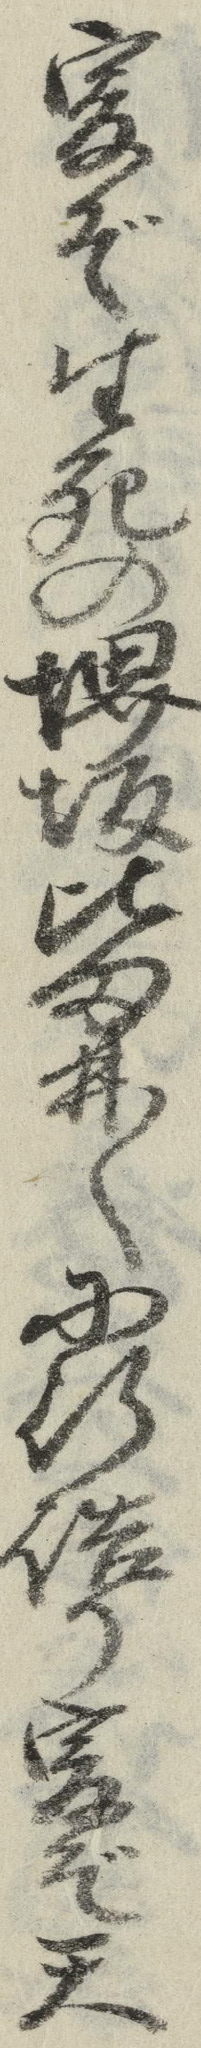爰ぞ生死の堺坂ひたい〳〵に行詰り爰ぞ天
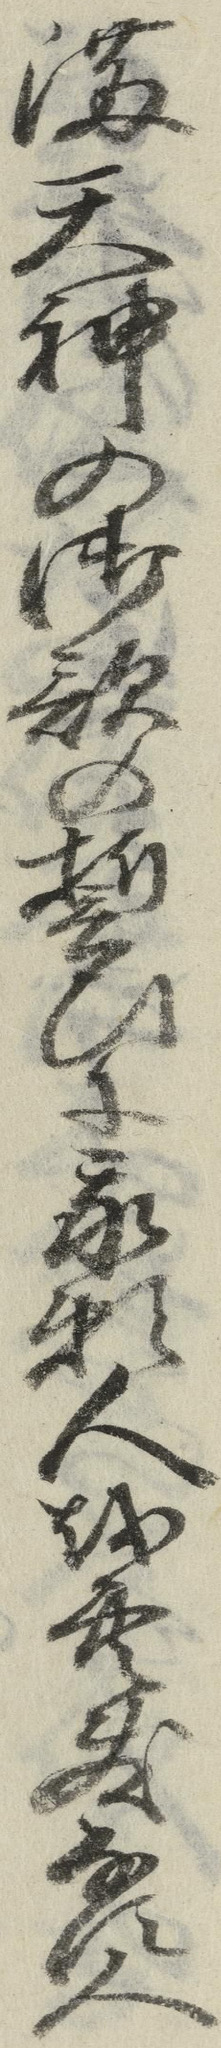満天神の御歌の誓ひに我頼人を空敷なす人
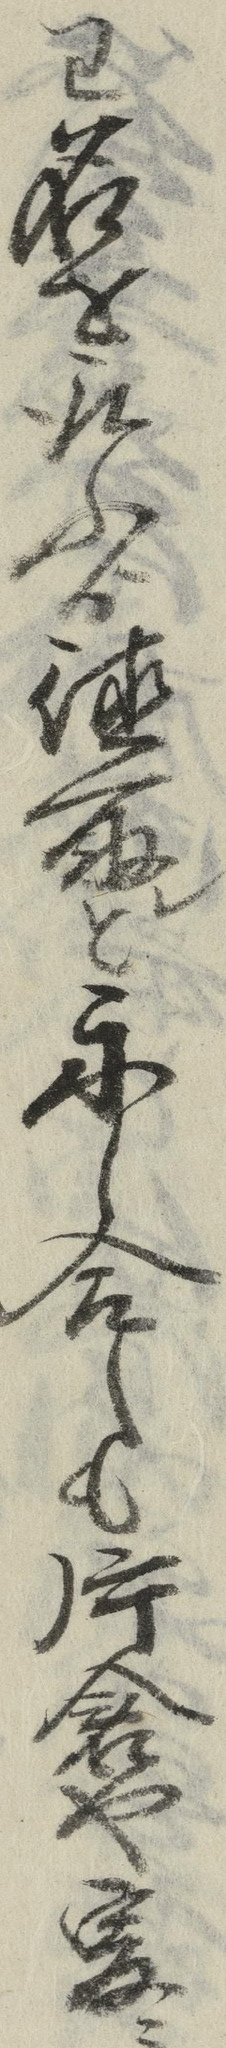わ名を取ふゟ徳取示し合しも片倉や爰に
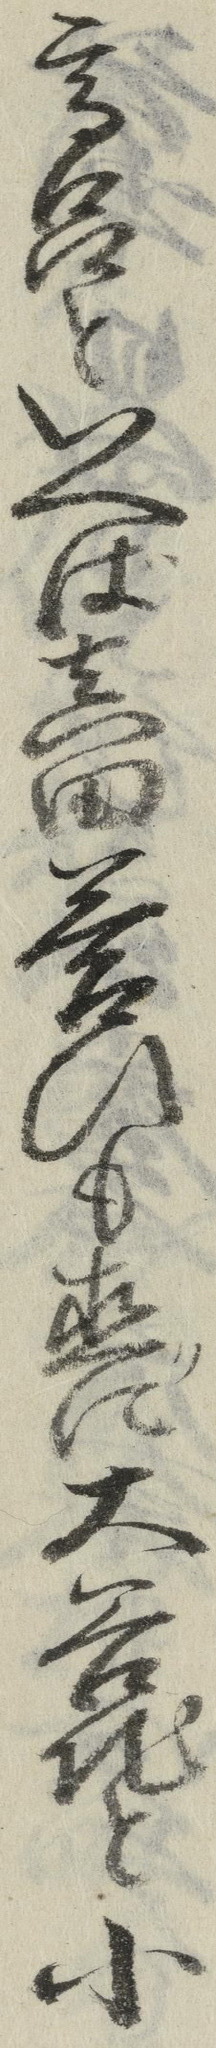高呂といへば真田養ひも直大谷地と小
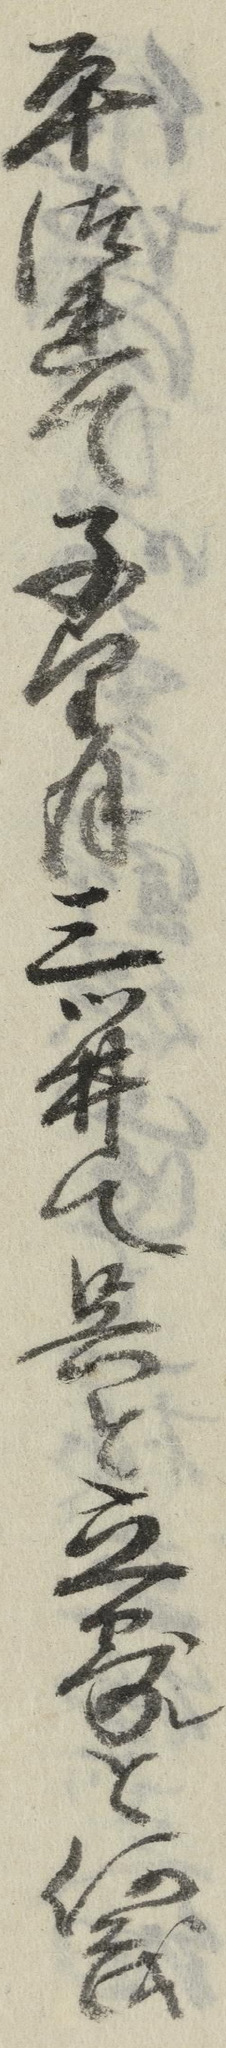平つれて子望月三ツ井て呉と立寄何も
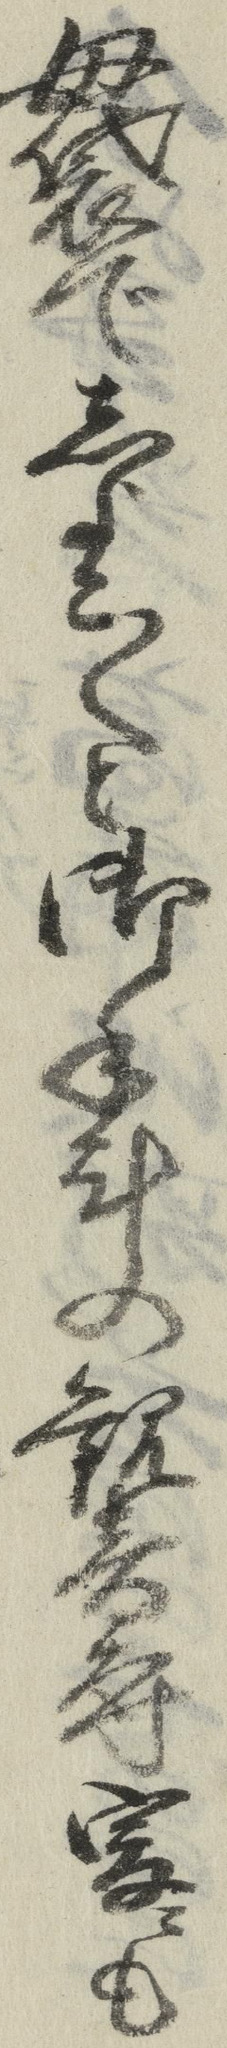母袋でしよこ〳〵と御手計の観音寺爰にも
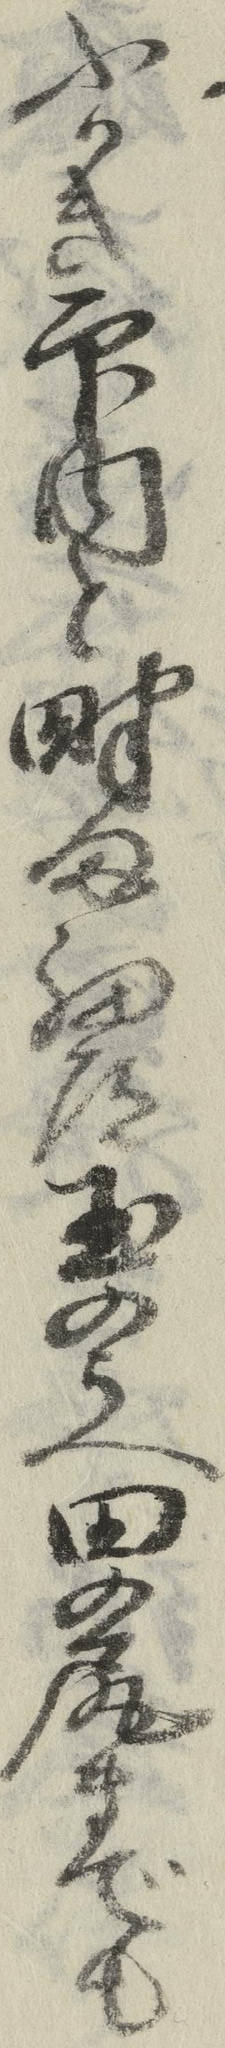ふかき印内と畔た細道玉のうへ田の尻までも
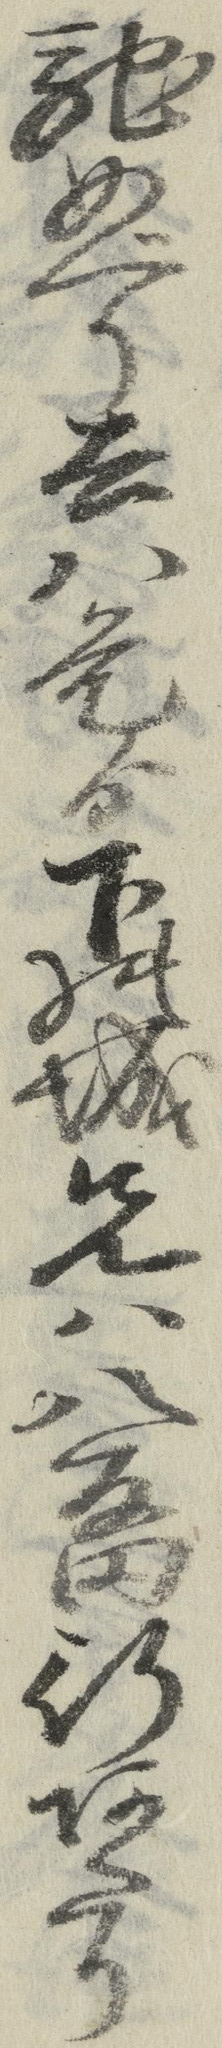駆めぐり去は是ゟ下の城先は八反田行あたり
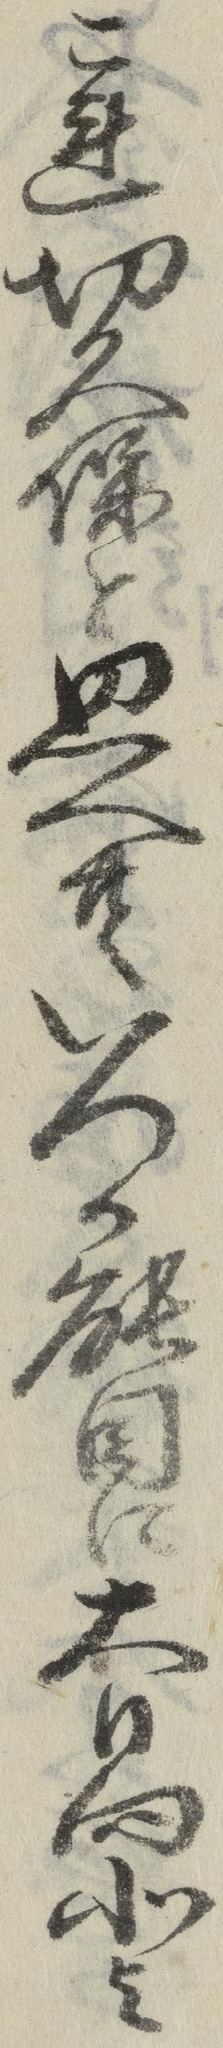これ切久保と思へ共いつかの目に大日向と

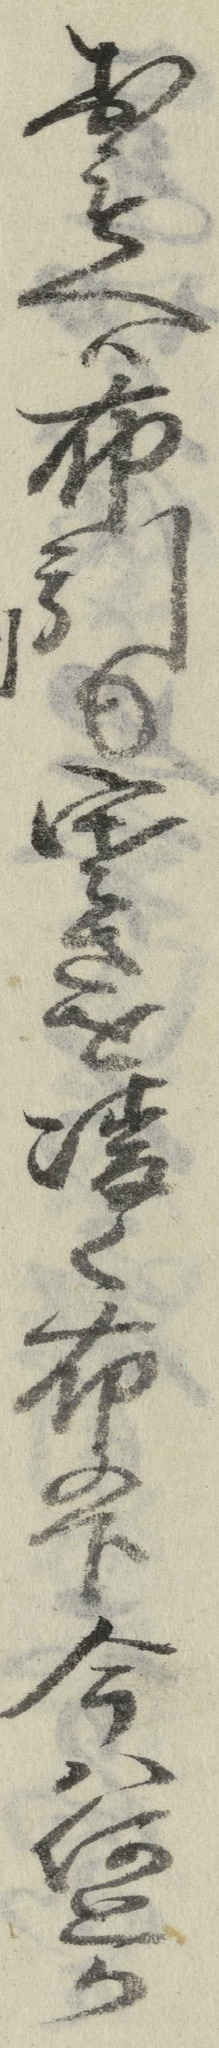おもへは布引も寒さを凌く布の下今は何とか
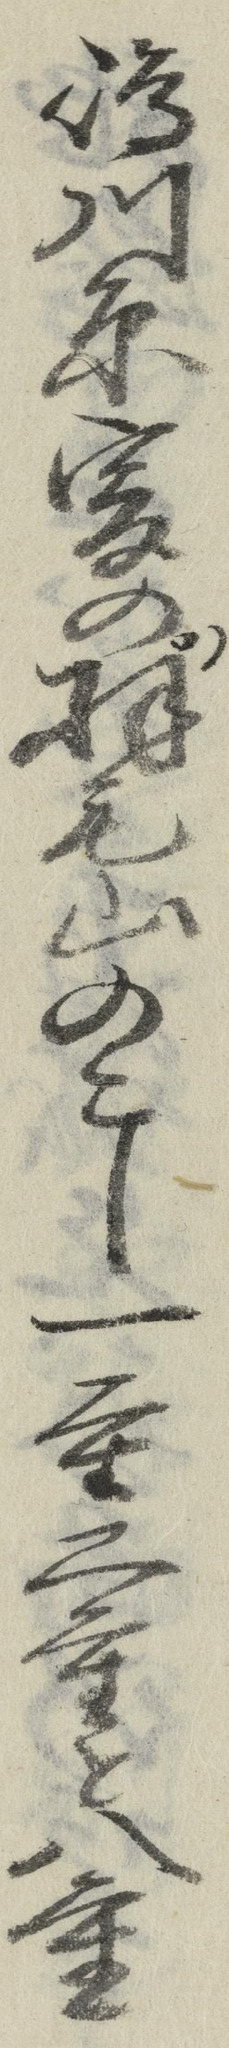嶋川原爰の川村元山のこし一重二重と八重
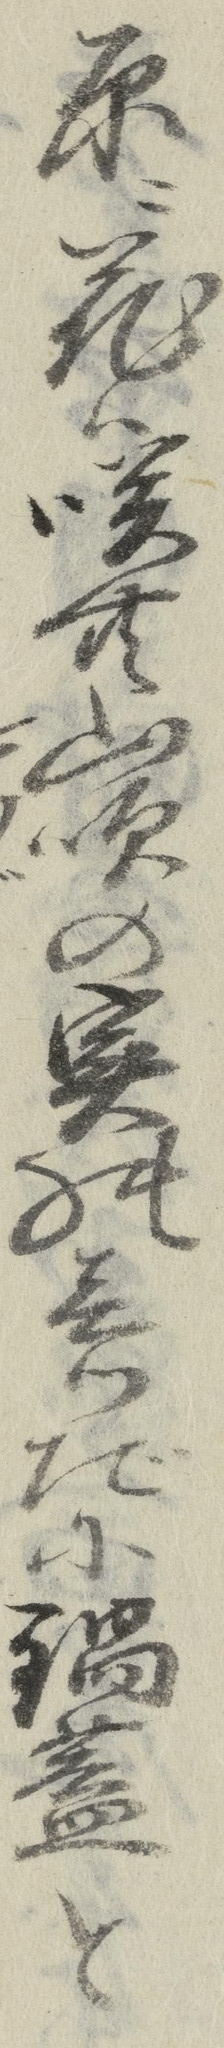原にニ］花は咲共山吹の実の無つだに鍋蓋と
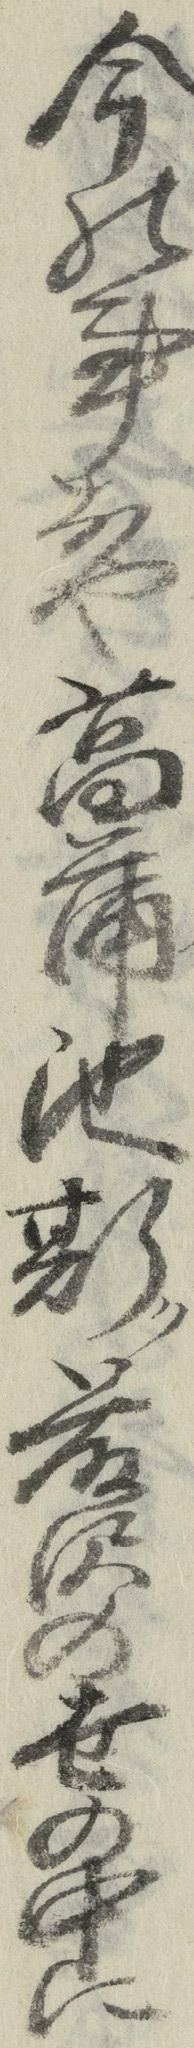今の事おや菖蒲池斯藤沢の世の中に
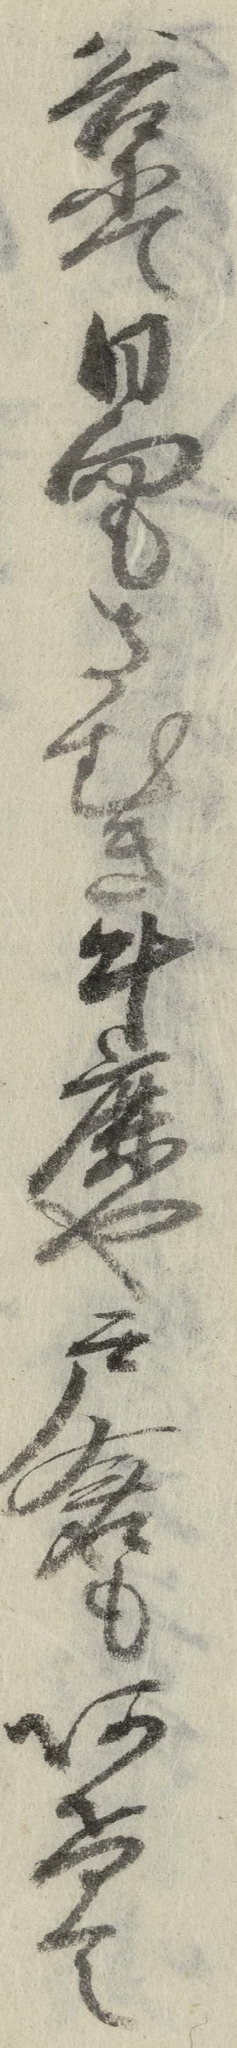谷にて日向もさむき計鹿や戸倉もあけて
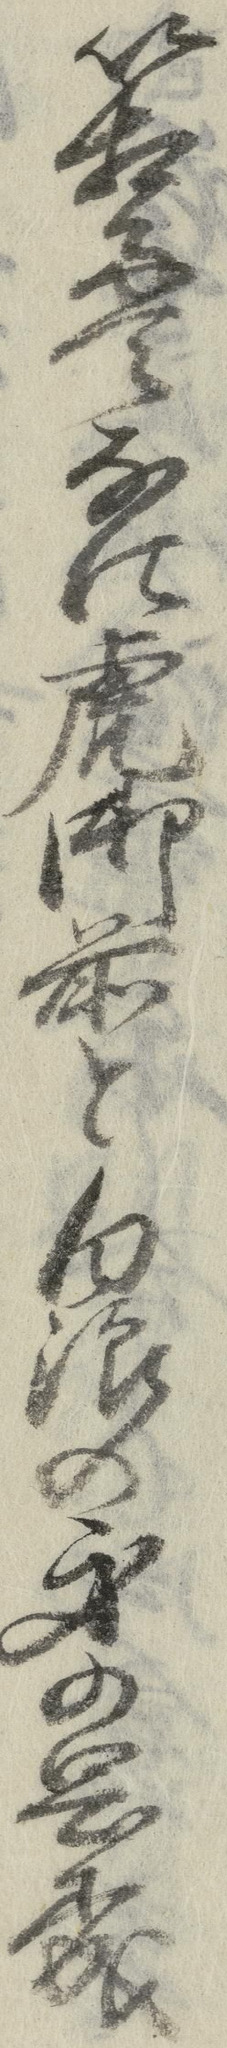いあいふてなに虎御前と白浪の身の岡に成
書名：浅間大焼騒動記　中
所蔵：東京大学地震研究所図書室 Earthquake Research Institute Library, The University of Tokyo, JAPAN
